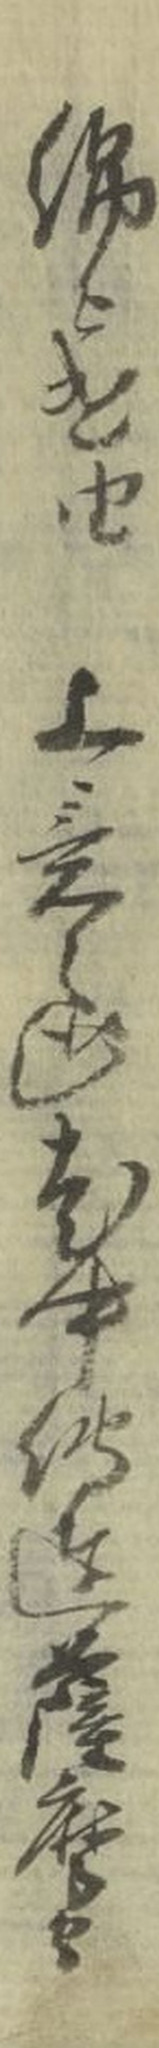綿被遣由上意之趣老中伝達薩摩守
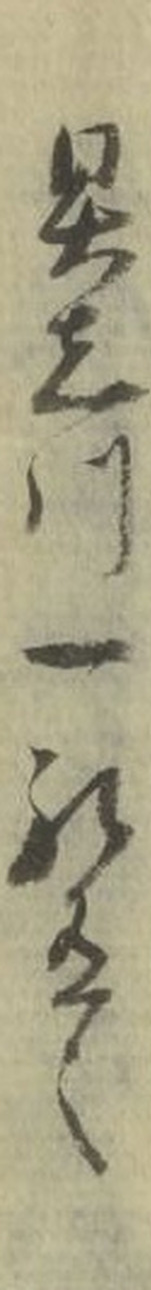具志川一礼有之

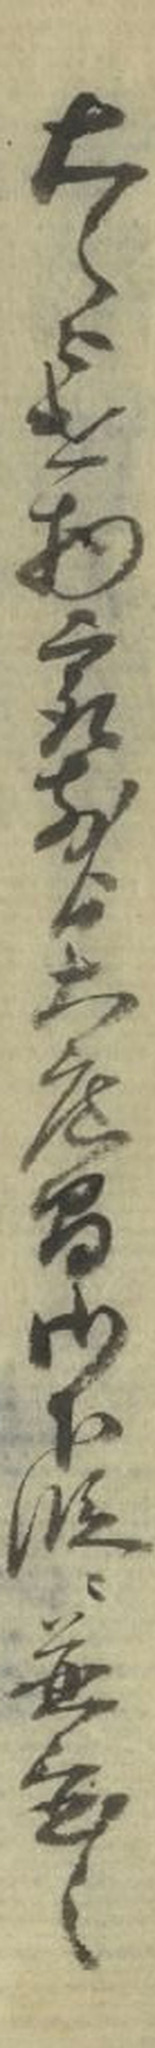右之被遣物最前ゟ大広間御下段に並置之
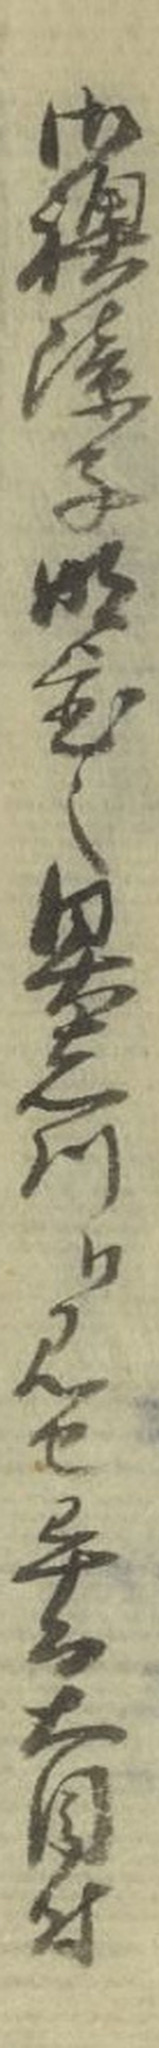御襖障子明置之具志川え見せ畢て大目付
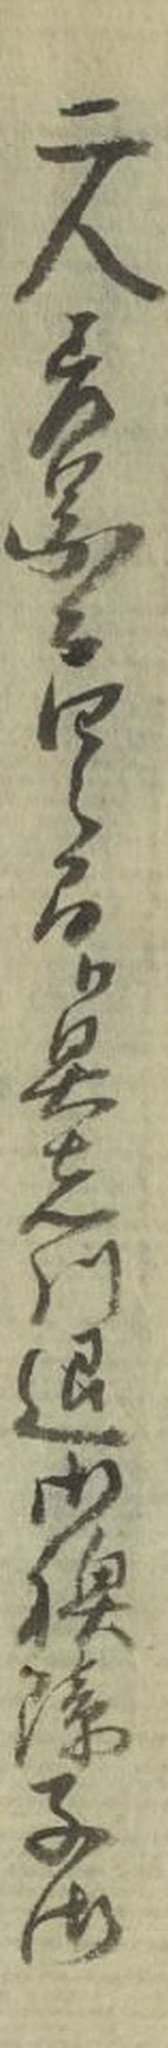二人差図而四之間え具志川退御襖障子御
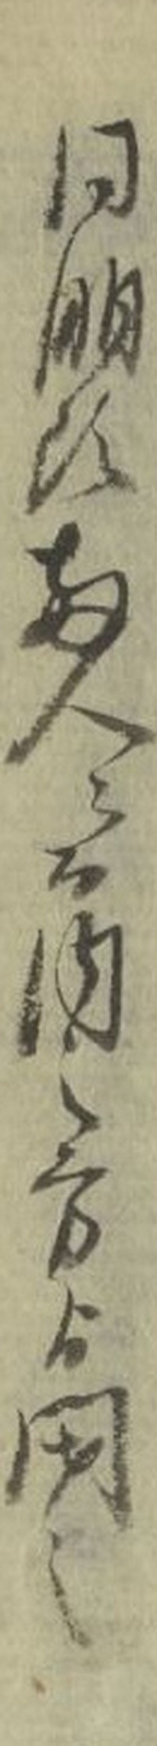同朋頭両人にて内之方ゟ閉之
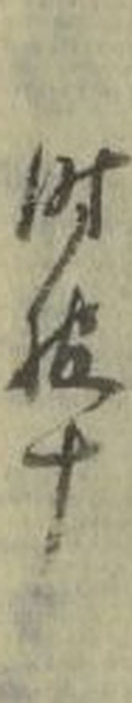時服十
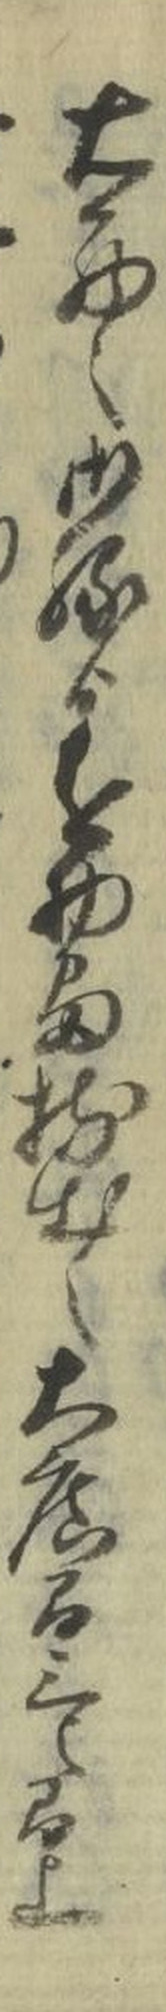右西之御縁ゟ進物番持出之大広間三之間上
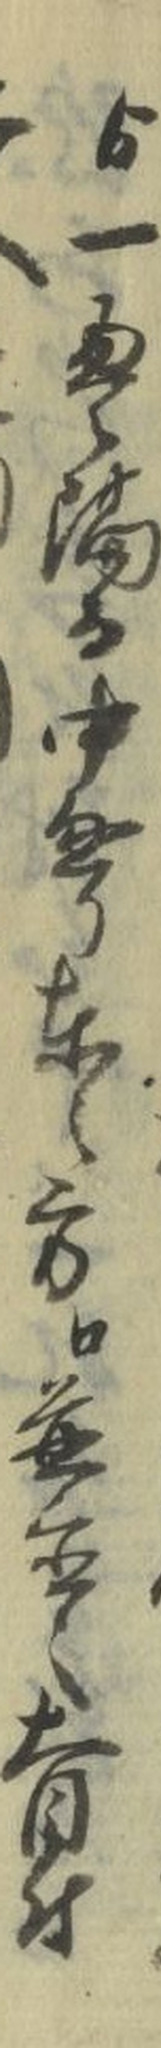ゟ一畳隔て中通り東之方え並置之大目付
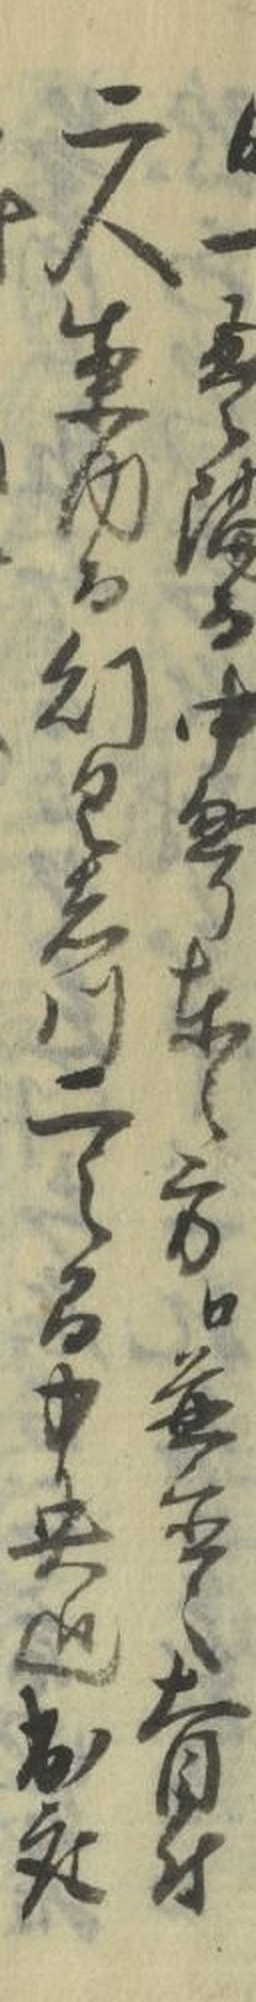二人案内而則具志川二之間中央迄出座
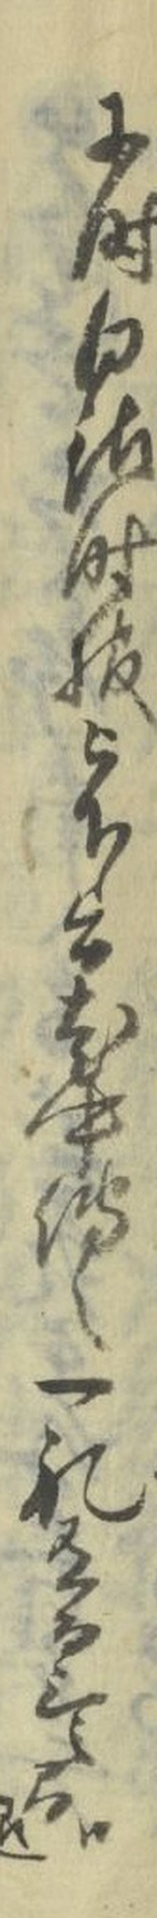于時白銀時服被下旨老中伝之一礼有て三之間え退
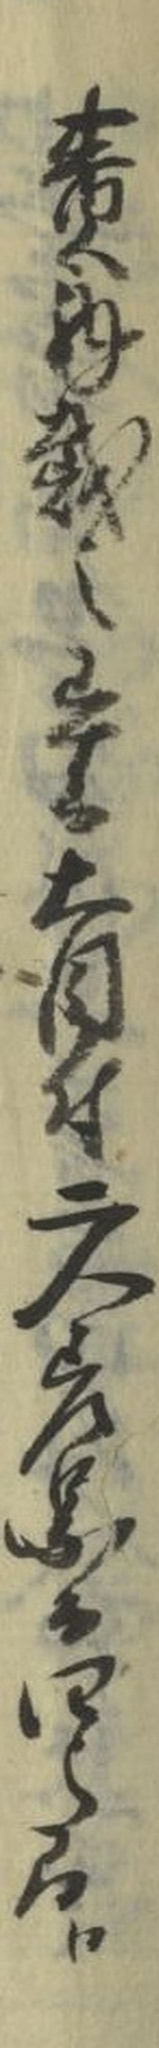賚拝戴之畢て大目付二人差図而四之間え
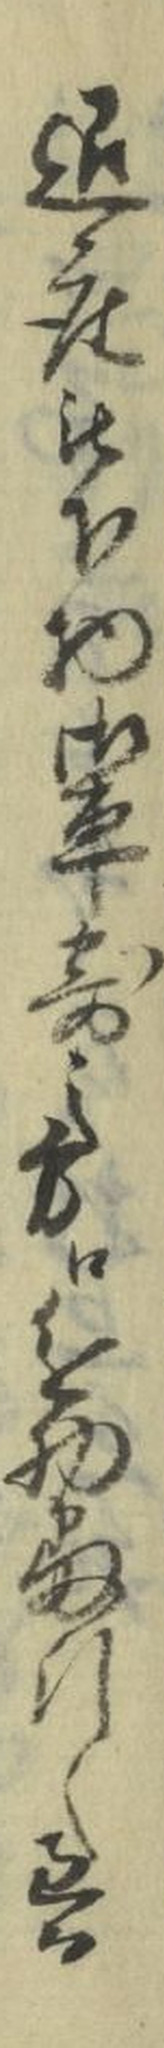退座被下物御車寄之方え進物番引之過て
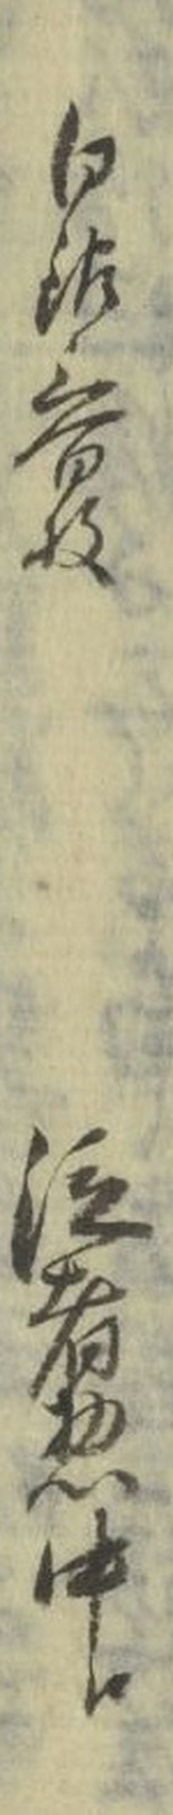白銀三百枚従者惣中え
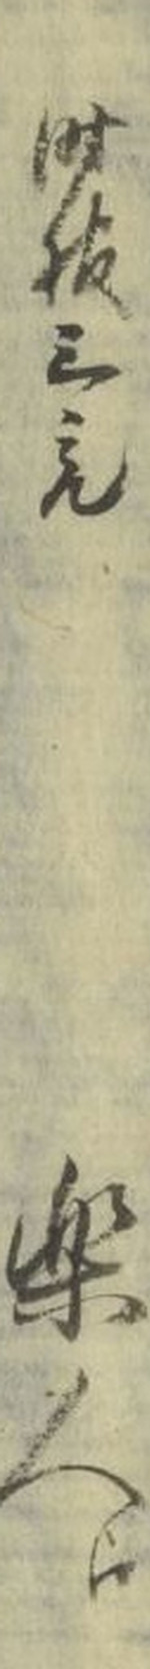時服三宛楽人え
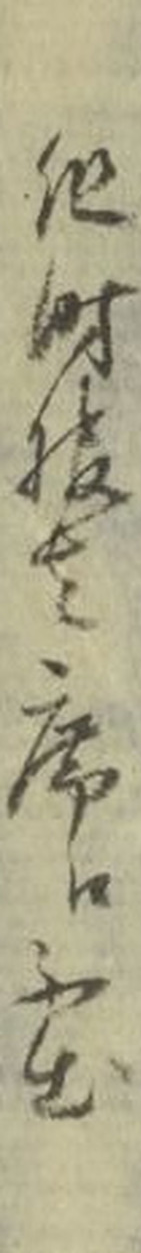但時服は席え不出
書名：戊辰琉球人来朝之式 全
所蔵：University of the Ryukyus Library
